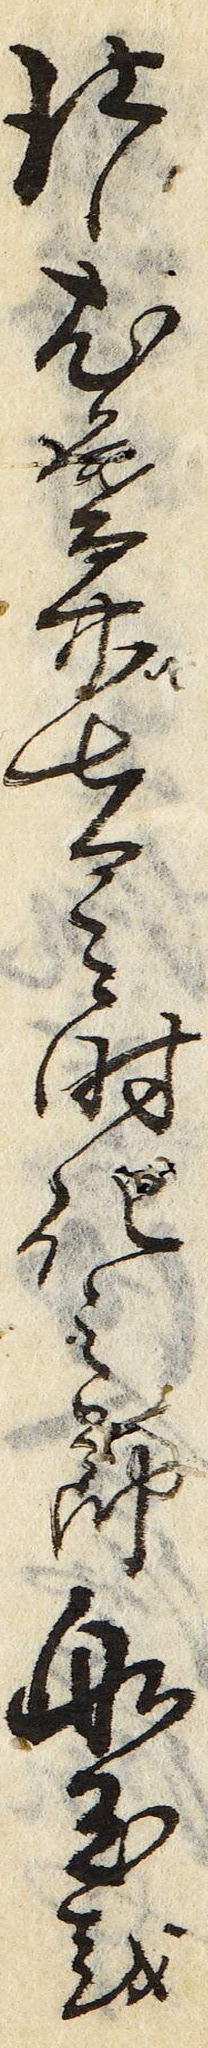仕候尤暮廿七日之時化之節船玉を
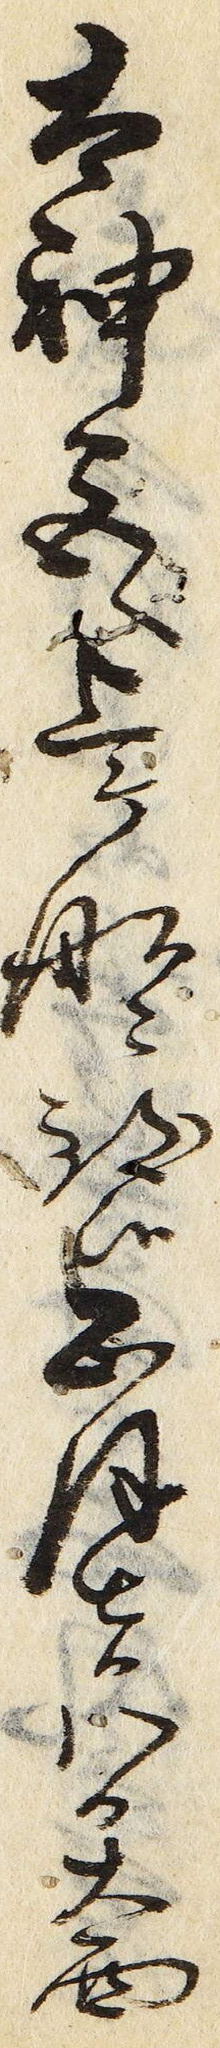太神宮へ上ケ船ニ致候正月七日八日大西
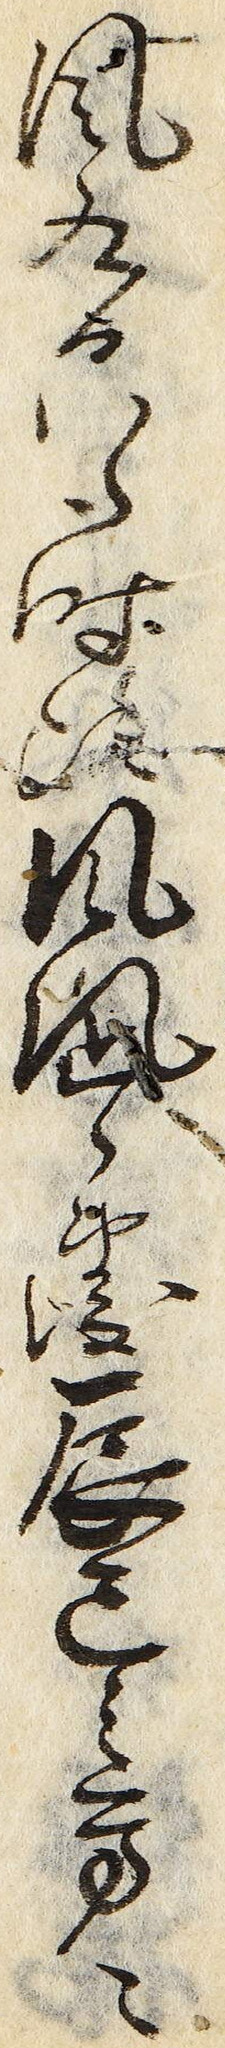風九日八ツ時頃風凪候処辰巳之方ニ
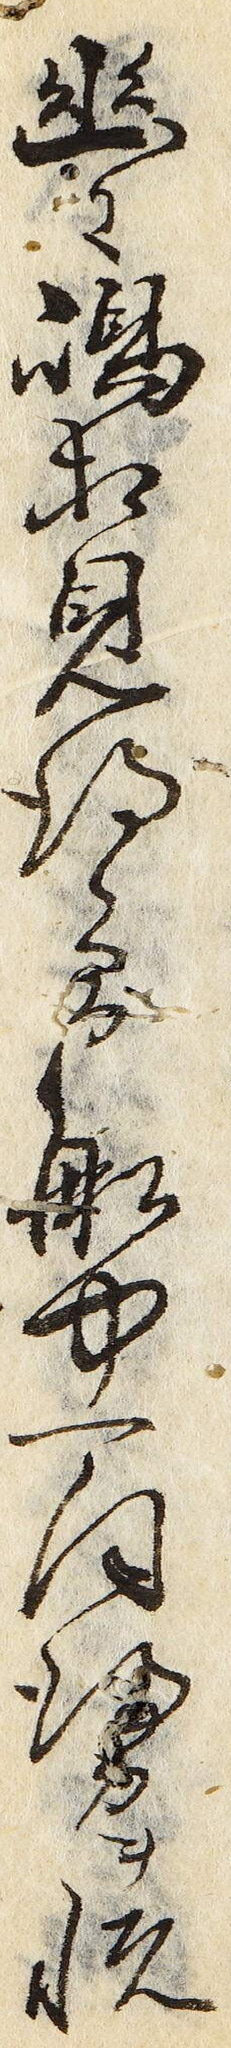幽に嶋相見得候間船中一同帰るヲ悦
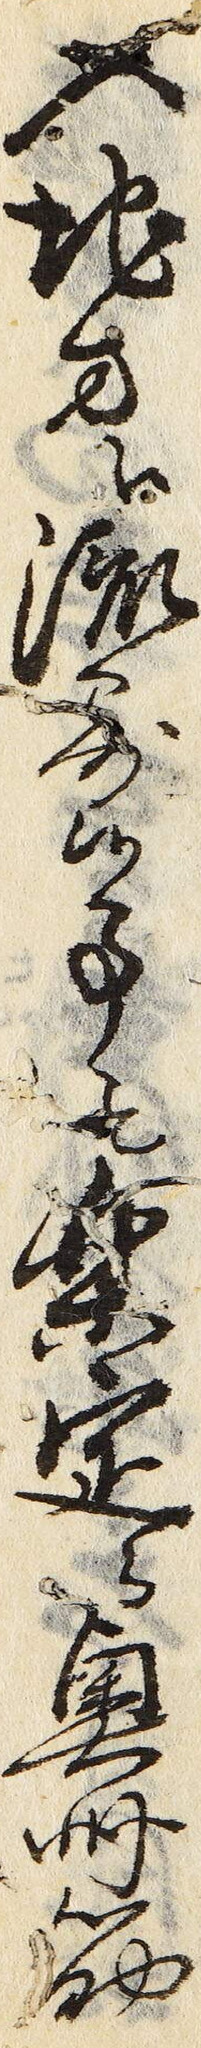入地方江流寄候事も定而奥州筋
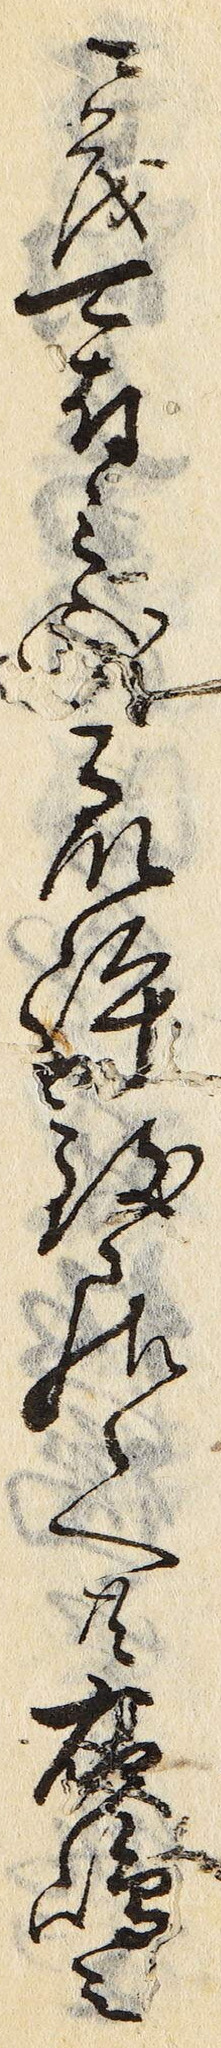ニも可有之衆評致居候へ共右嶋之
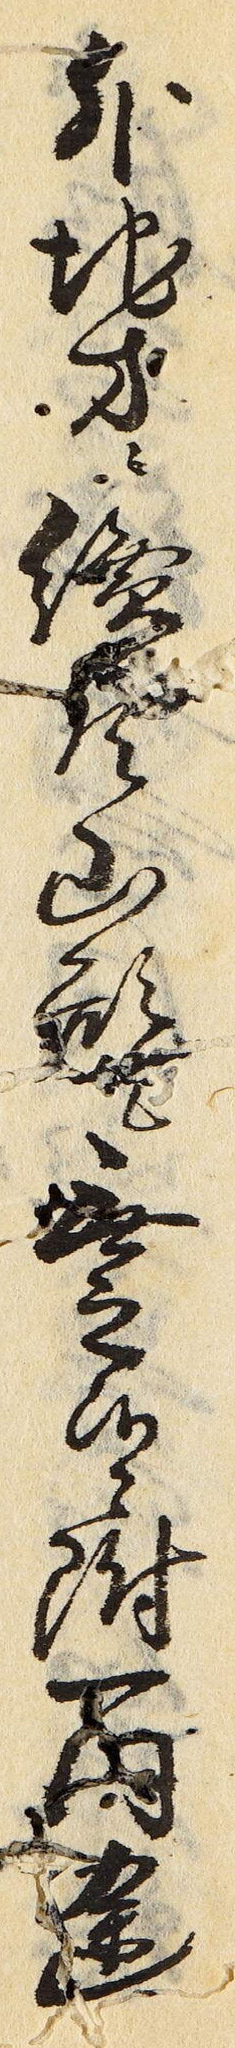外地方ニ続候山形も無之候ニ付一同途
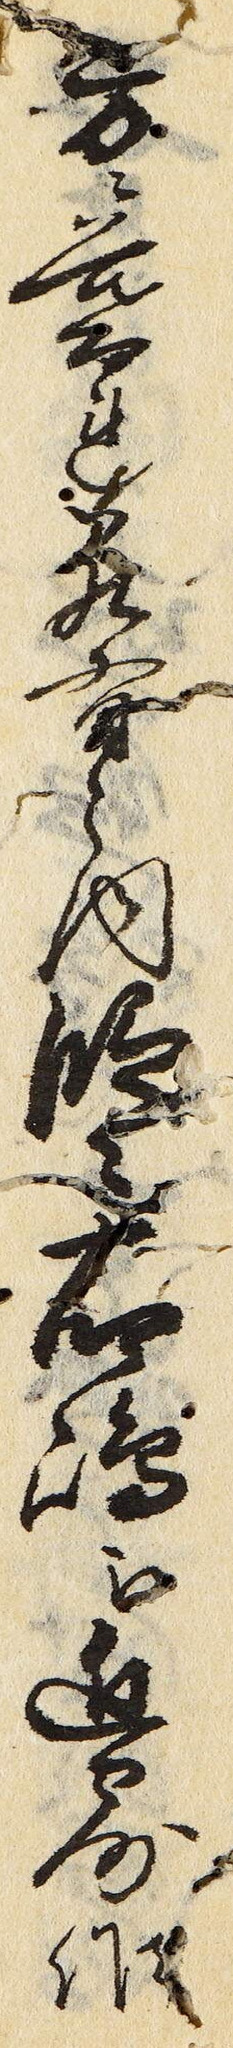方ニ暮れ罷有候内段々右嶋江近寄候
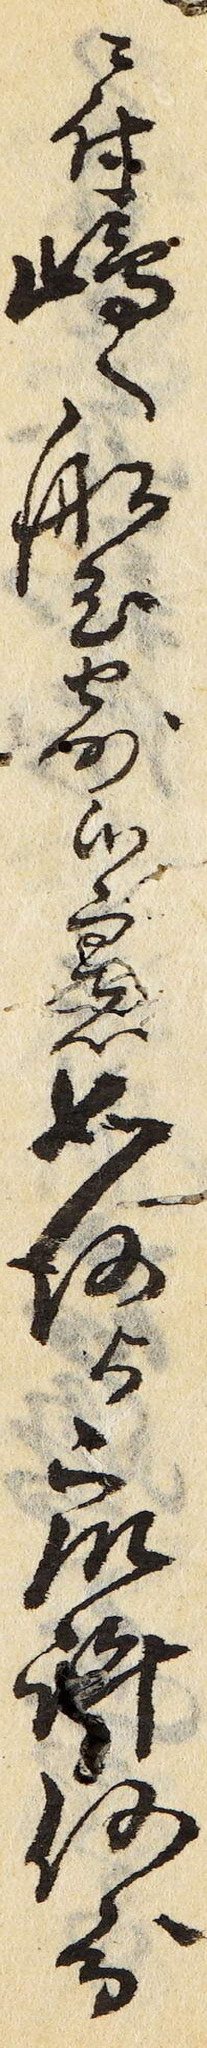ニ付嶋へ船玉寄候而は如何与衆評何分
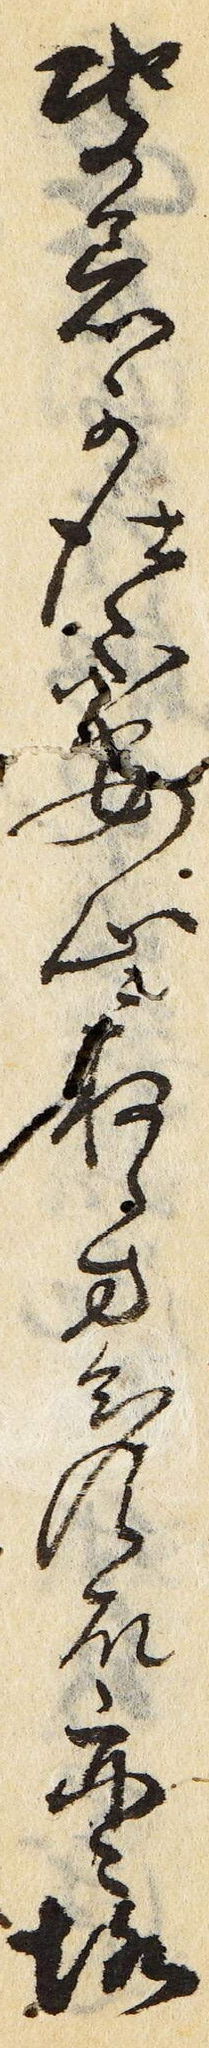決着不仕不安心存候方多候故亦々洛
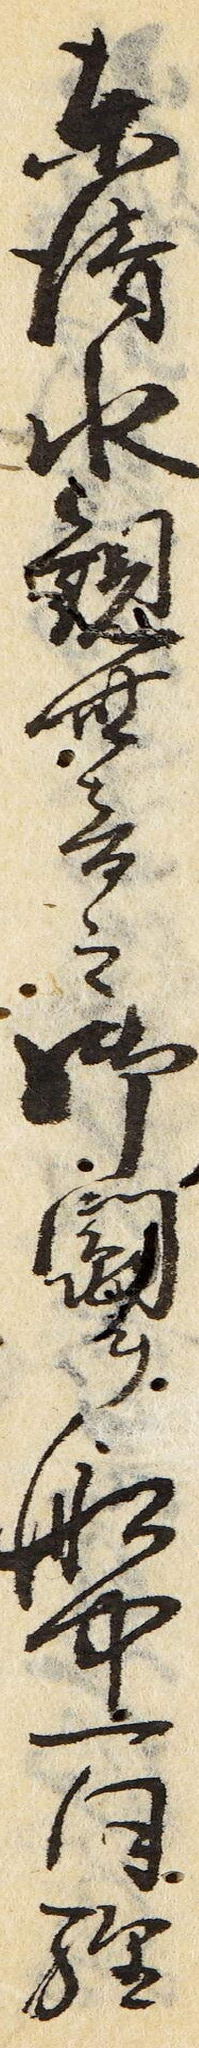東清水観世音之御鬮ヲ船中一同経
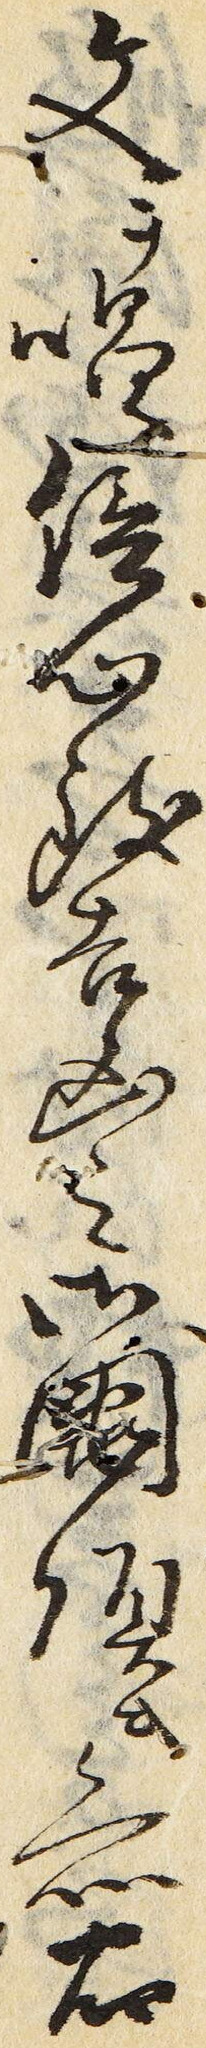文ヲ唱へ信心致吉凶之御鬮頂キ候処右
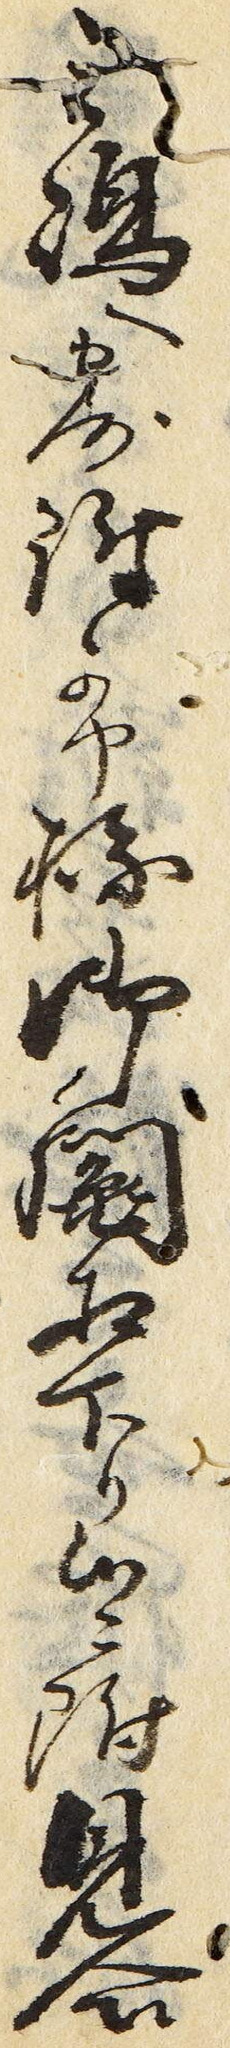之嶋へ寄付不申様御鬮相下り候ニ付見合
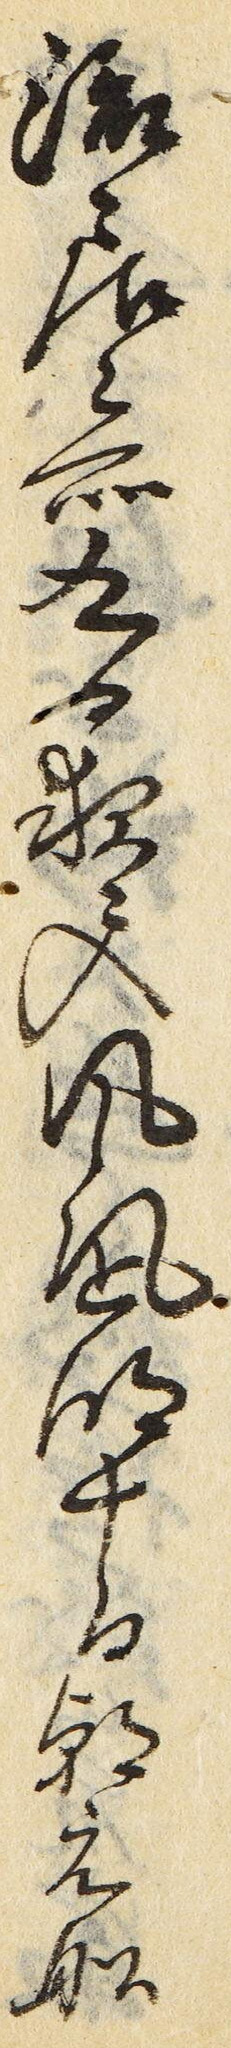流居候所九日夜ニ入風凪明十日朝元船

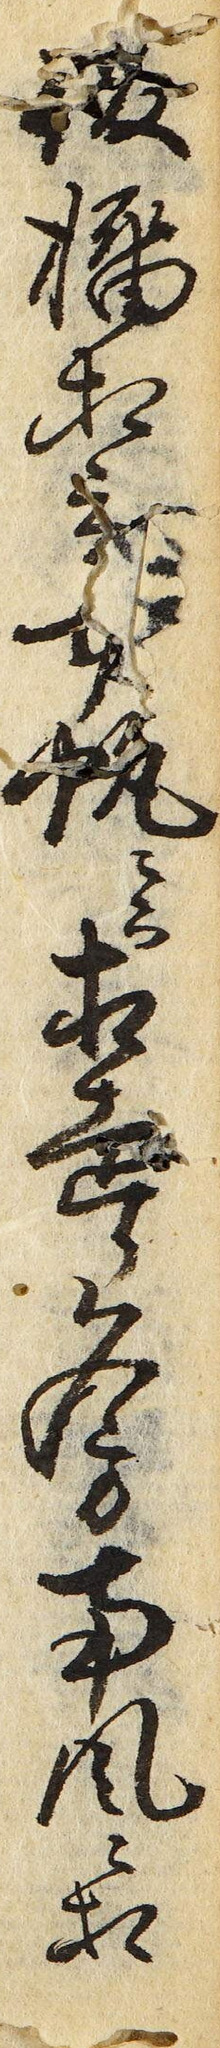致檣相帆ニ而相走り夕方南風ニ相
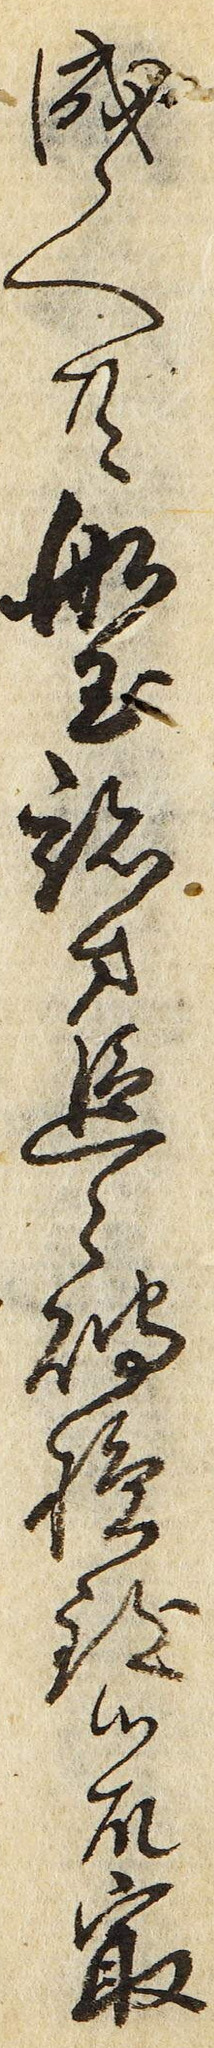成候へ共船玉諸方追々破損致候故最
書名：阿波幸宝丸漂流記
